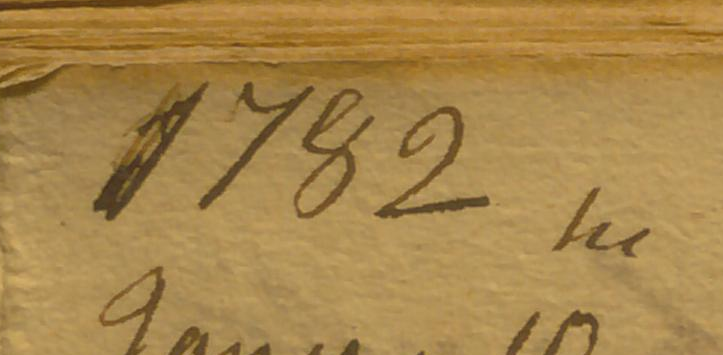1782
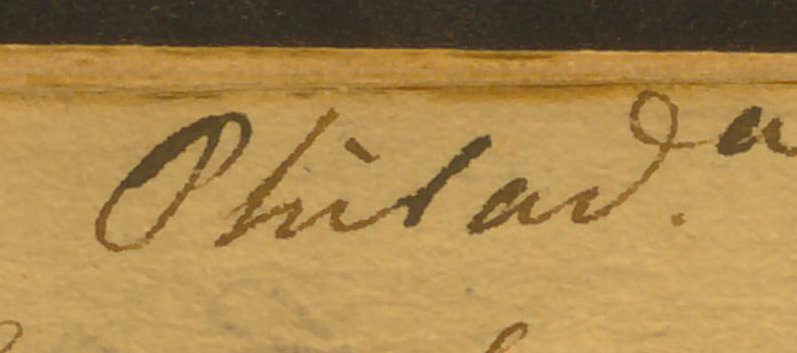Philad^a.
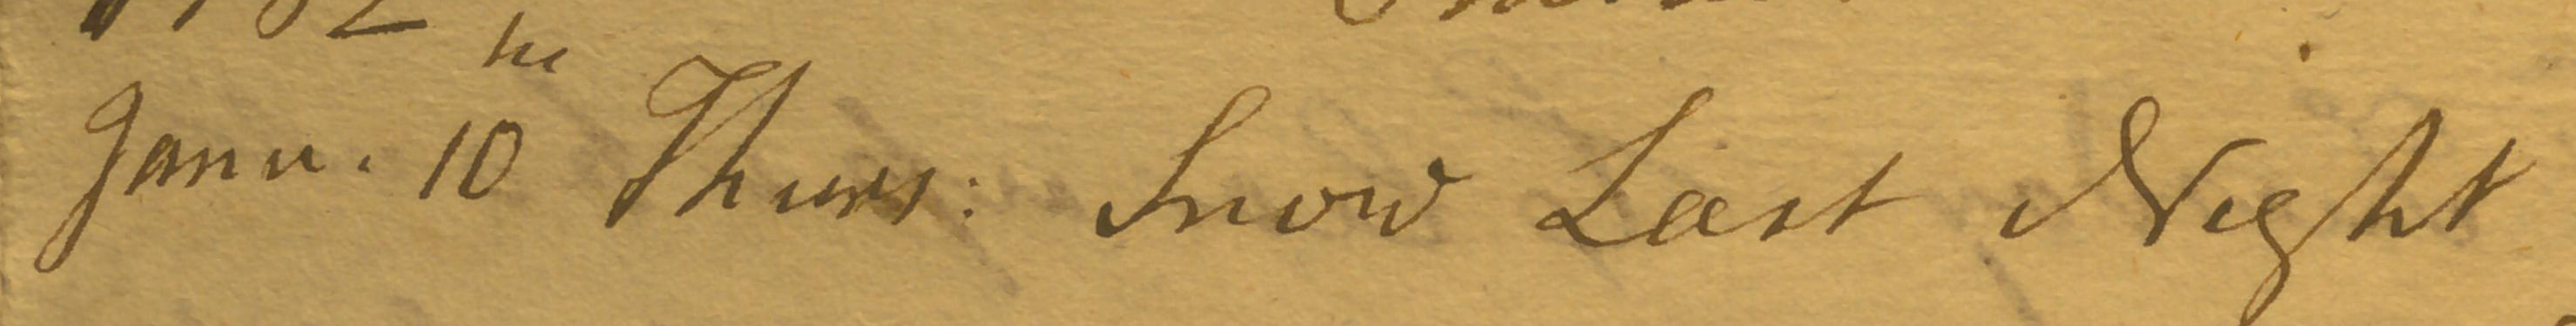Janu. 10^th Thurs: Snow Last Night
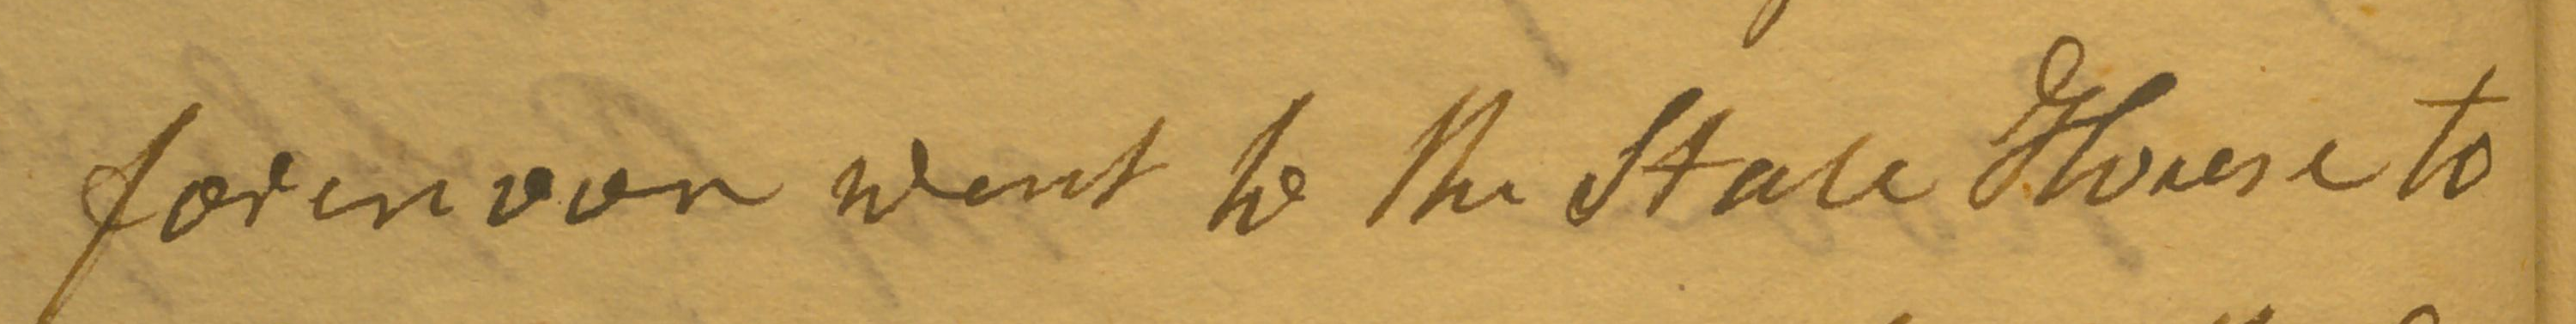forenoon went to the State House to
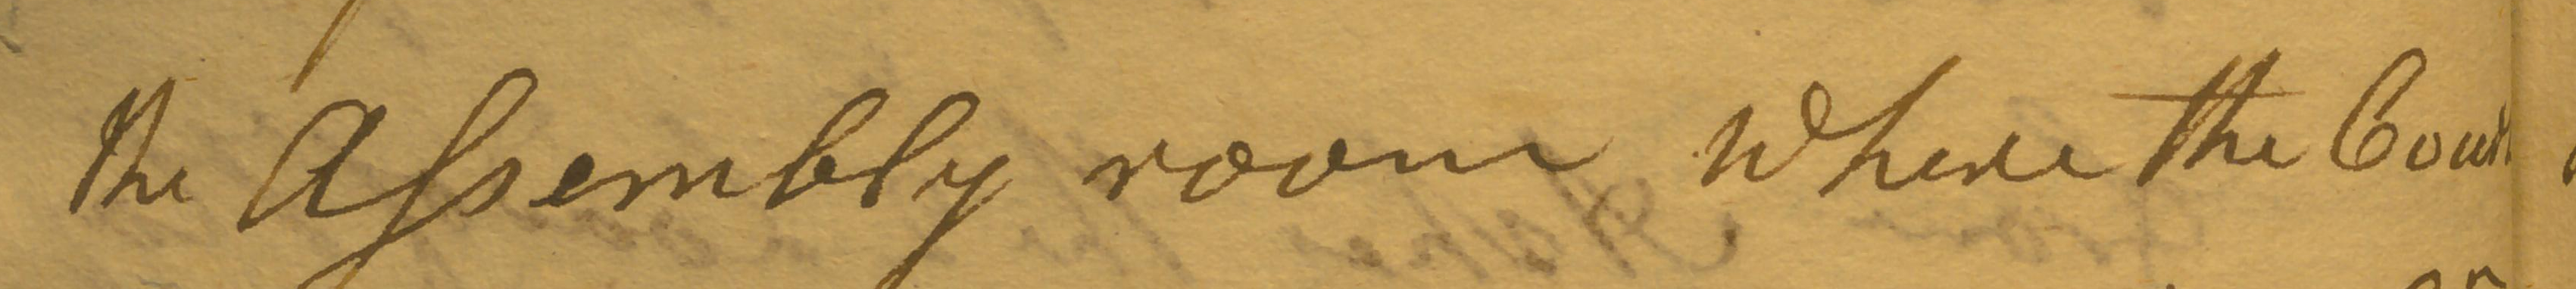the Assembly room, where the Court
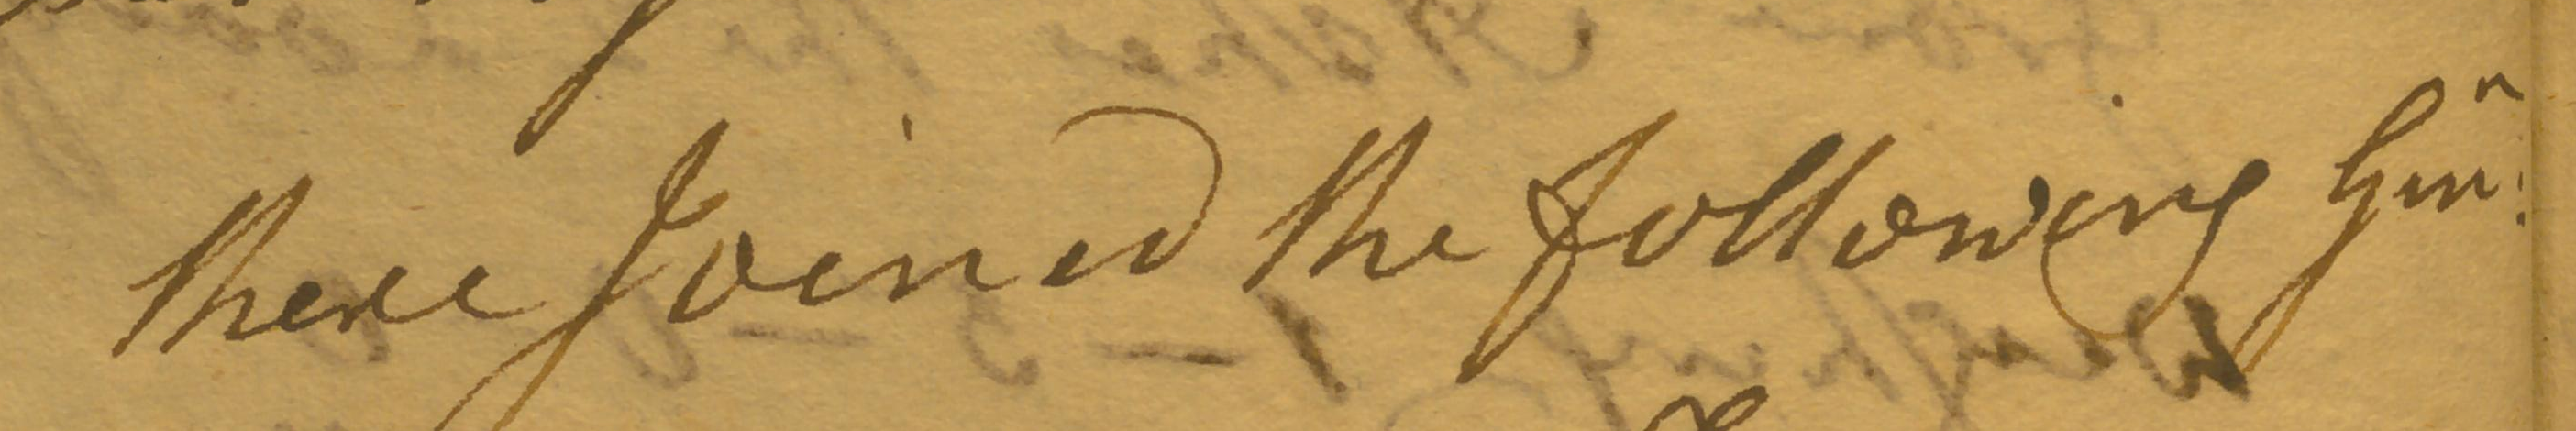there Joined the following Gen^n:
